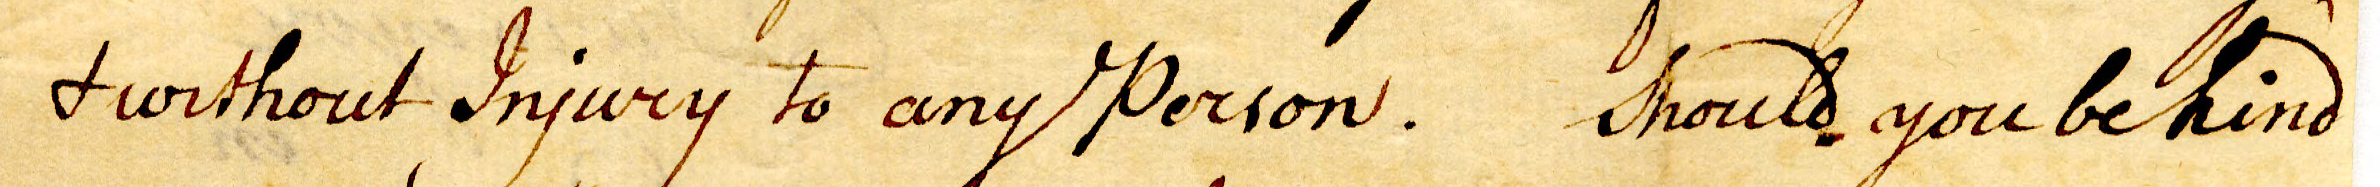& without Injury to any person. Should you be kind
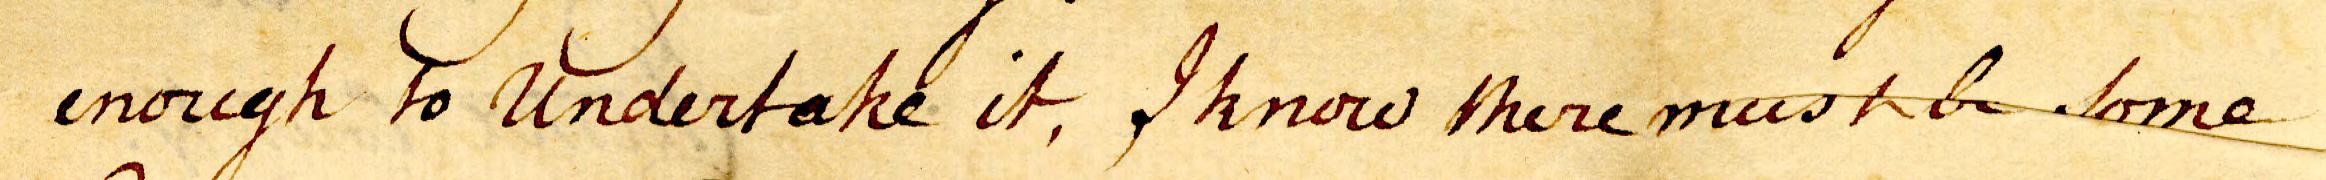enough to undertake it, I know there must be some
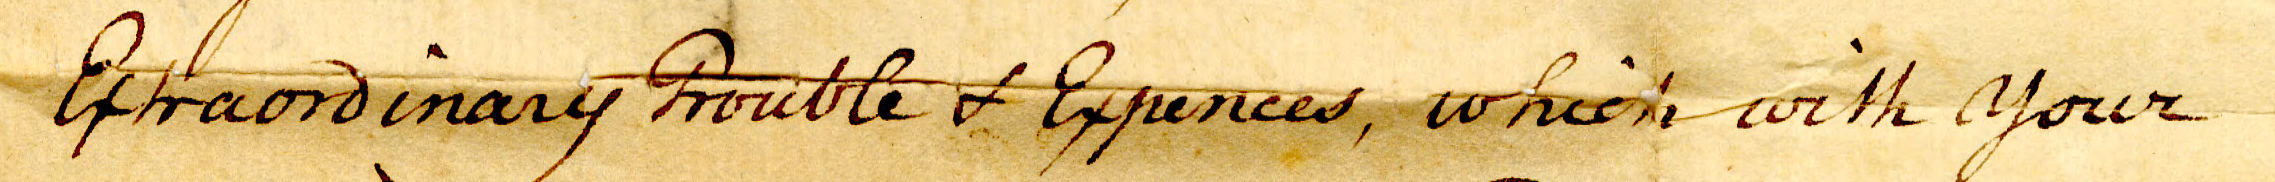Extraordinary Trouble & Expences, which with your
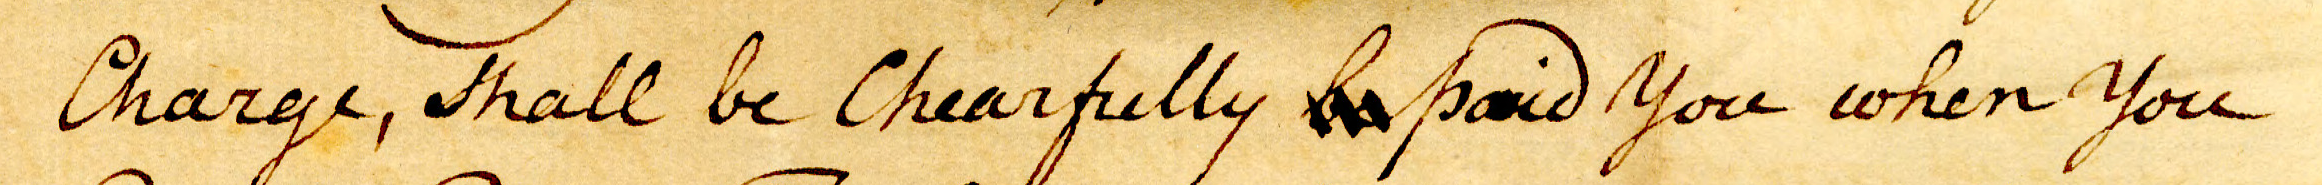Charge, shall be chearfully [be] paid you when you
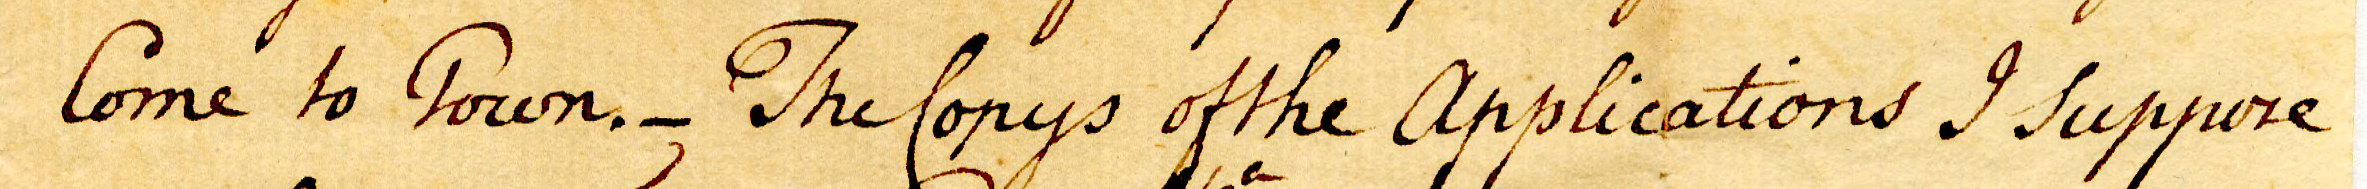Come to Town.- The Copys of the Applications I suppose
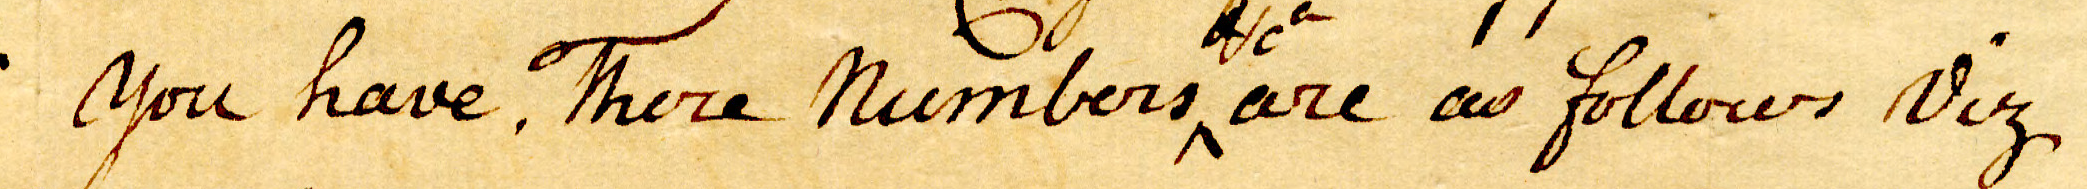you have. These numbers ^ are as follows Viz
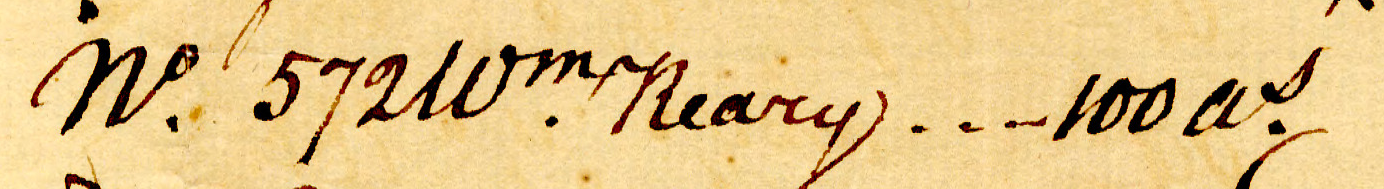N^o. 572 W^m. Reary...100a^s.
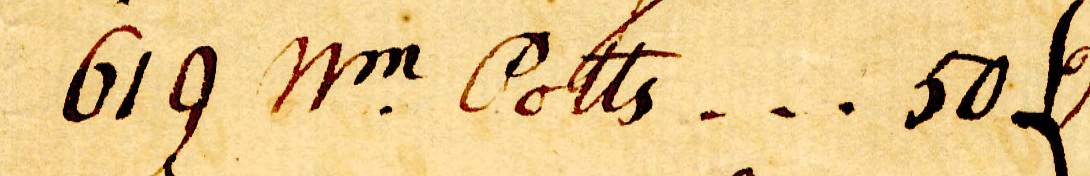618 W^m. Potts...50
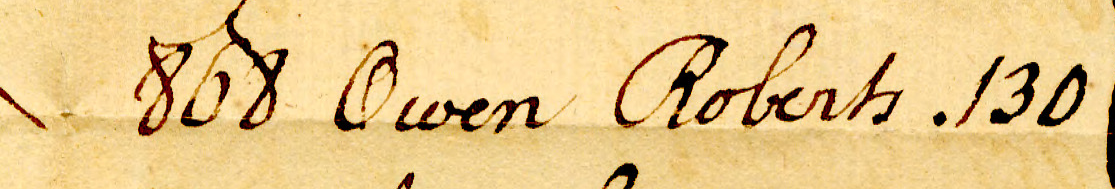868 Owen Roberts. 130
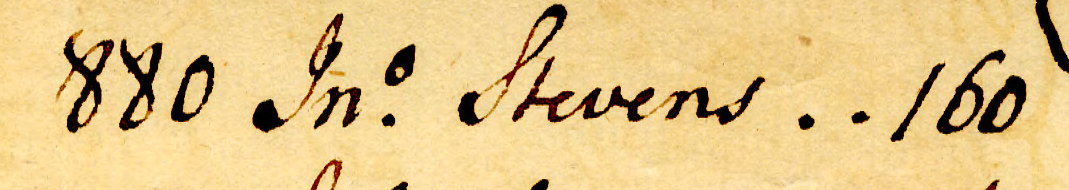880 Jn^o. Stevens.. 160
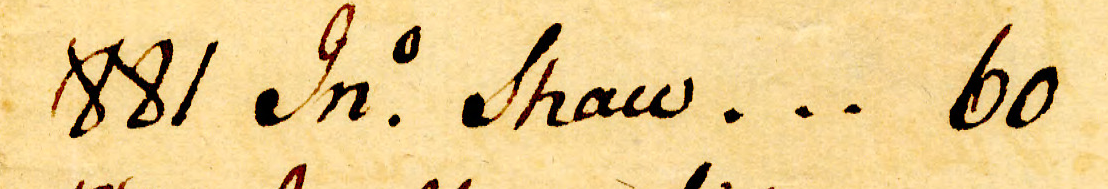881 Jn^o. Shaw... 60
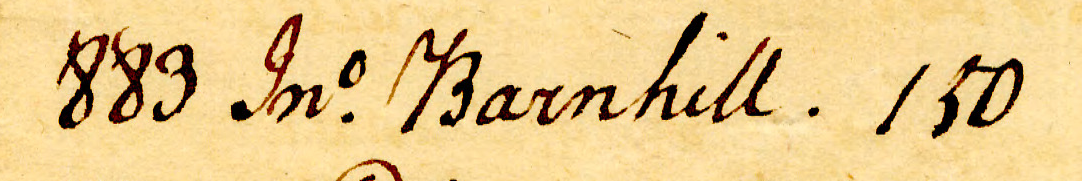883 Jn^o. Barnhill. 150
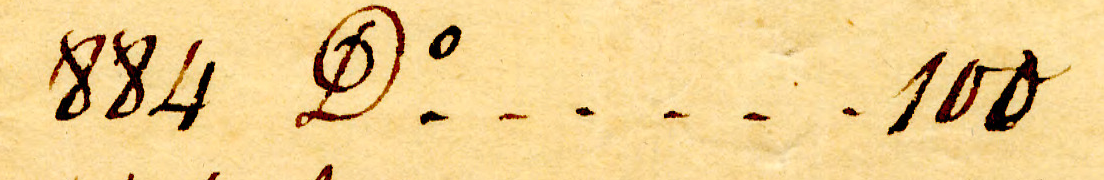884 D^o...... 100
